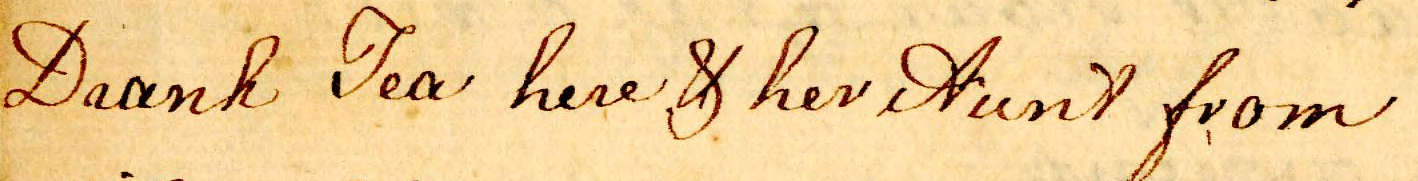Drank Tea here & her Aunt from
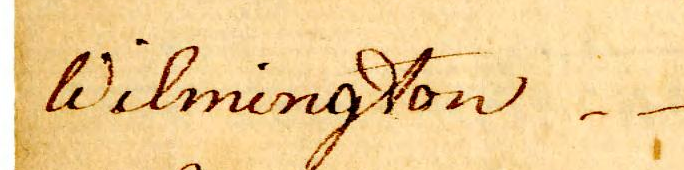Wilmington.-
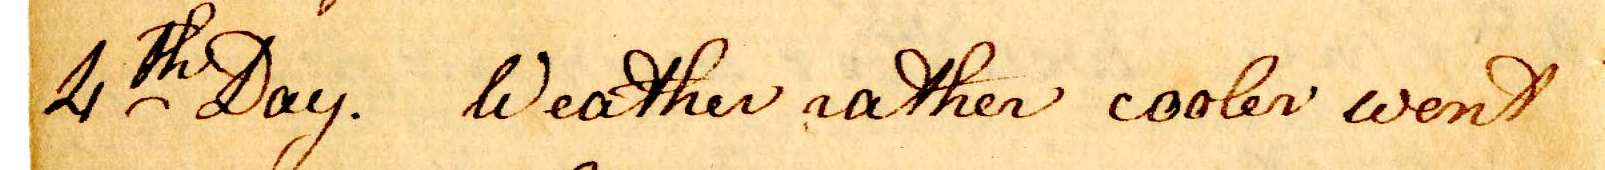4^th Day. Weather rather cooler went
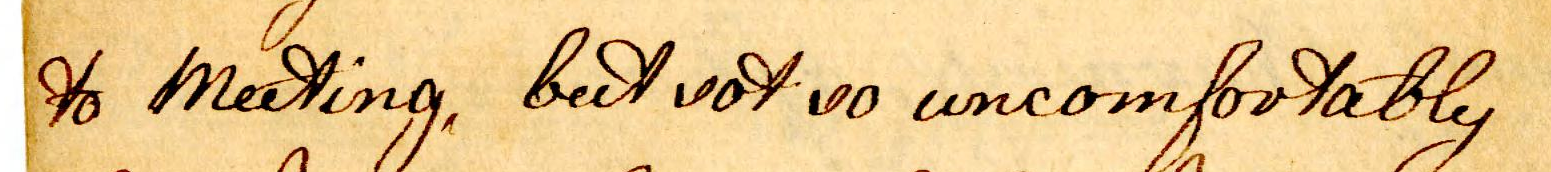to Meeting, but got so uncomfortably
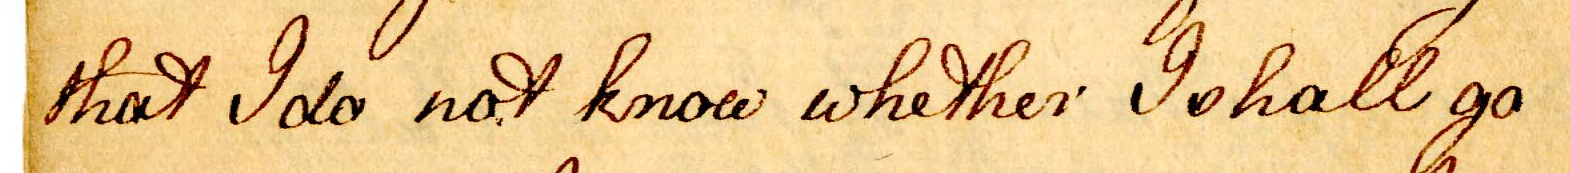that I do not know whether I shall go
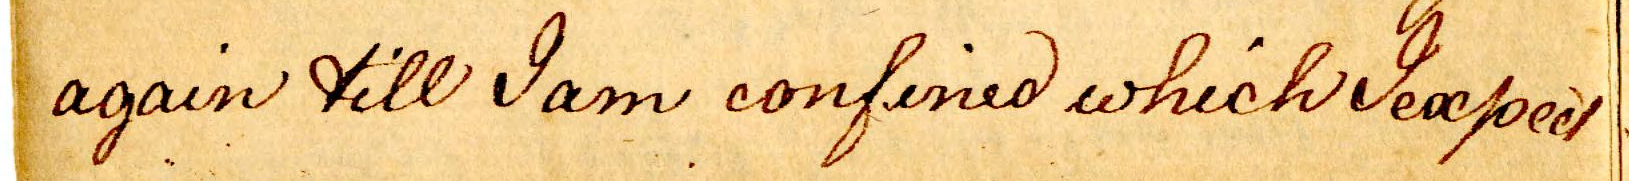again till I am confined which I expect
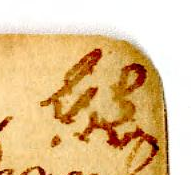43
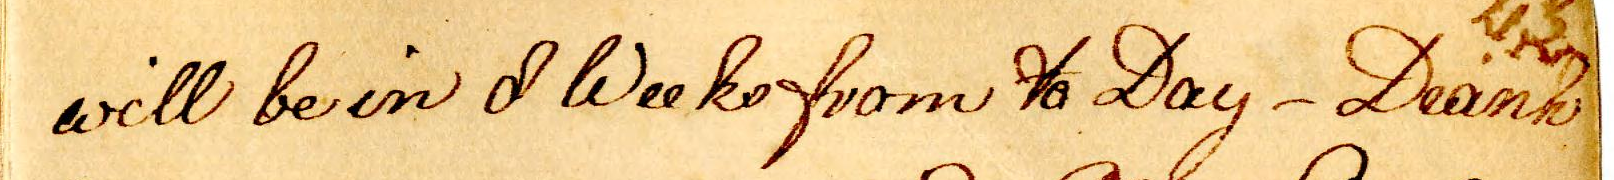will be in 8 Weeks from to Day- Drank
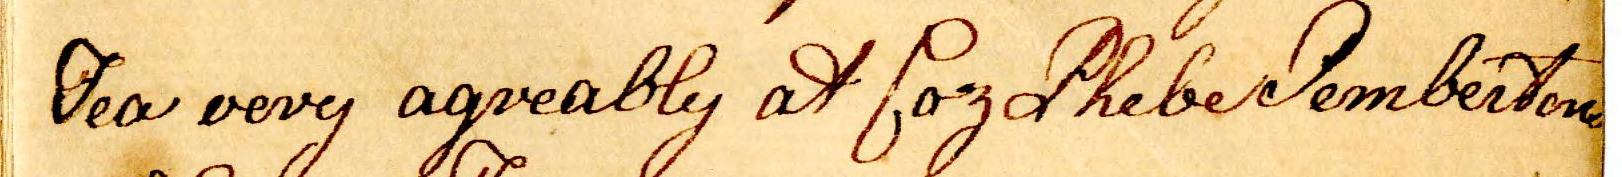Tea very agreably at Coz Phebe Pembertons
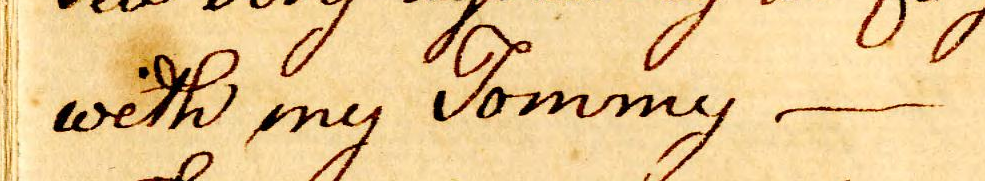with my Tommy-
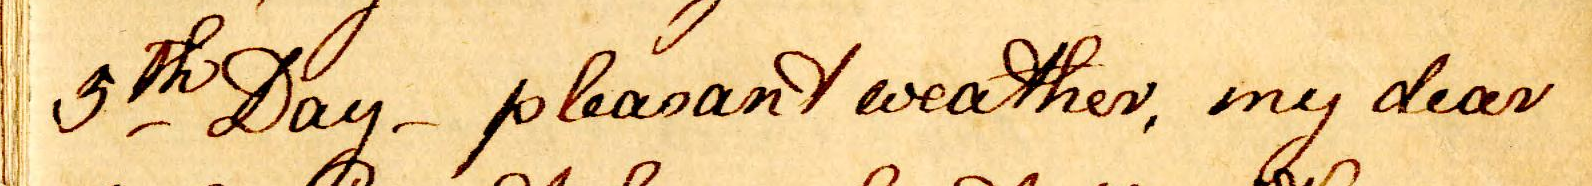5^th Day- pleasant weather, my dear
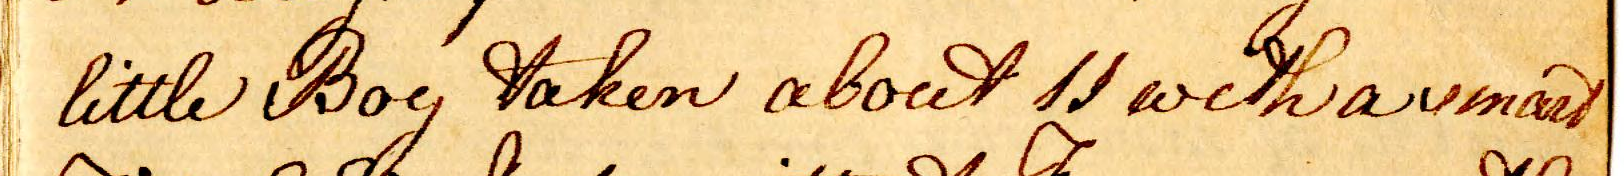little Boy taken about 11 with a smart
